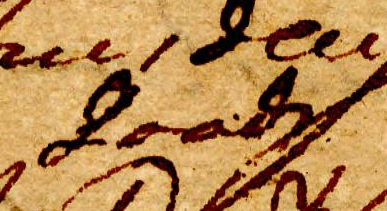goods
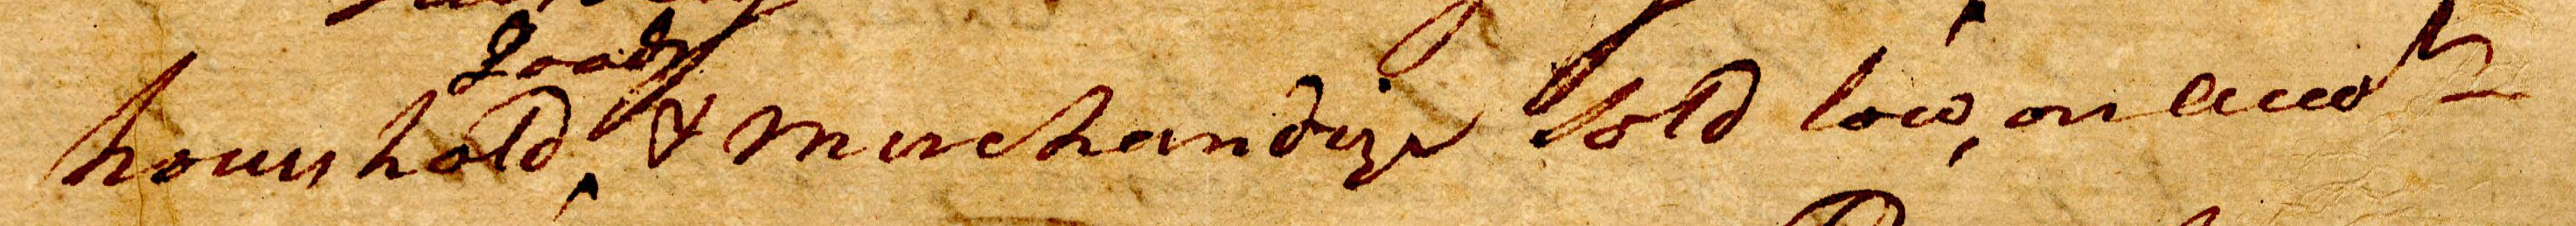household ^ & merchandize sold low, on acco^t
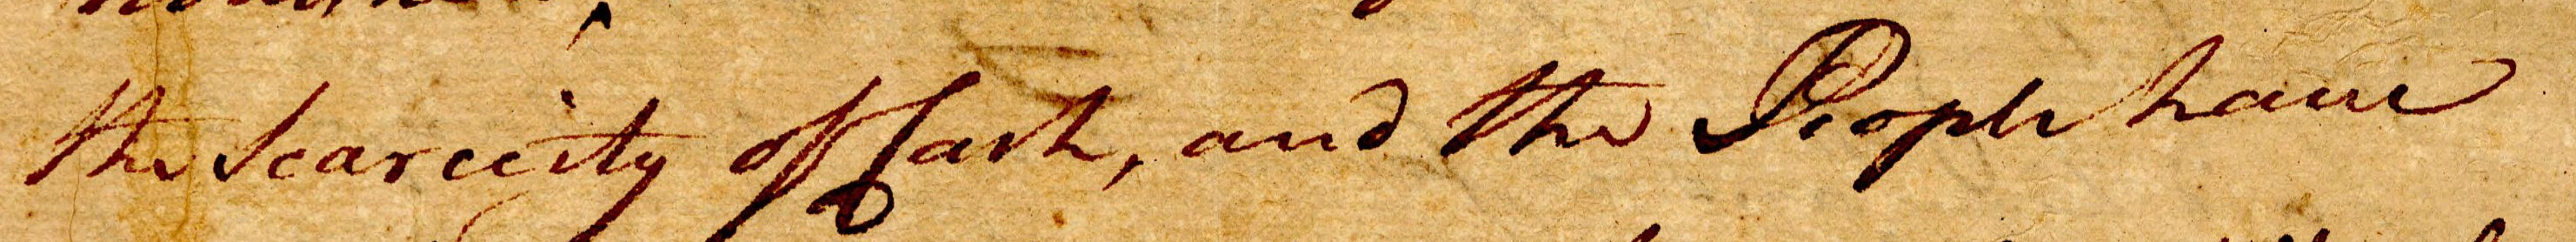the Scarcity of Cash, and the People have
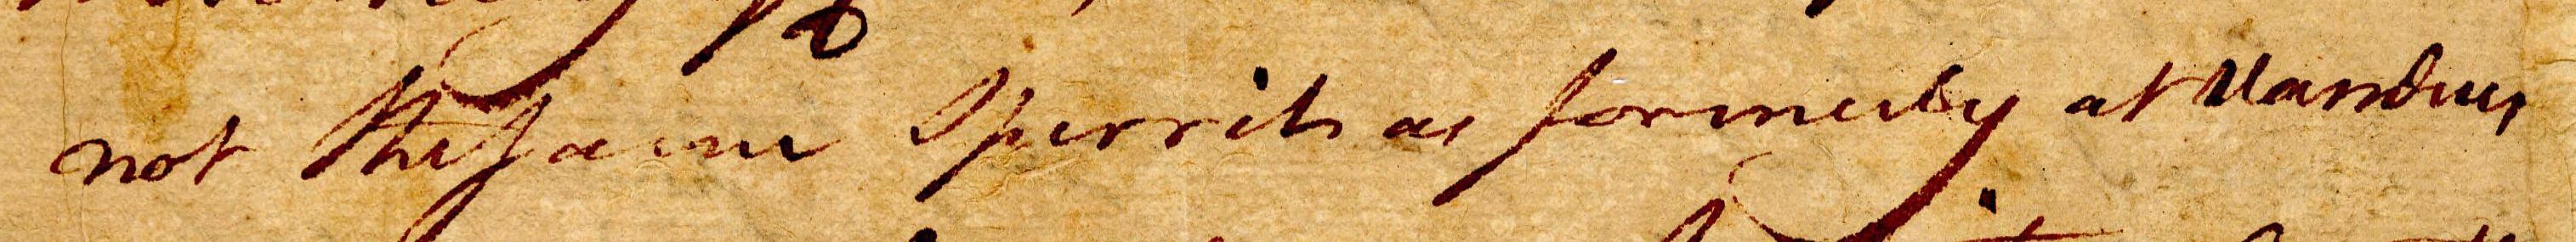not the same Sperrits as formerly as Vandues
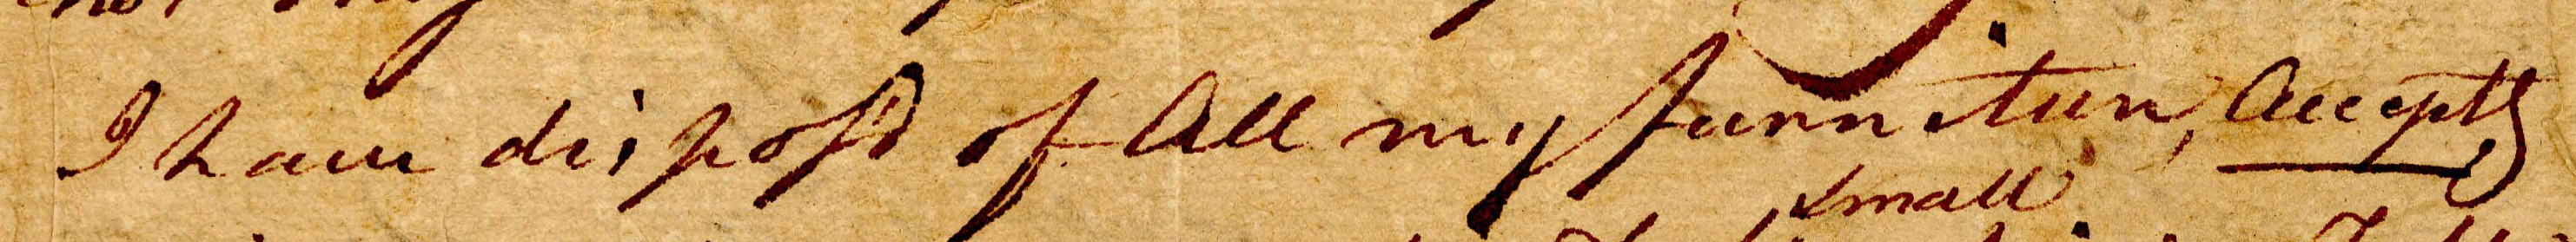I have disposd of All my furniture, Acceptg
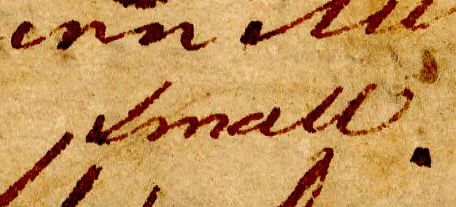small
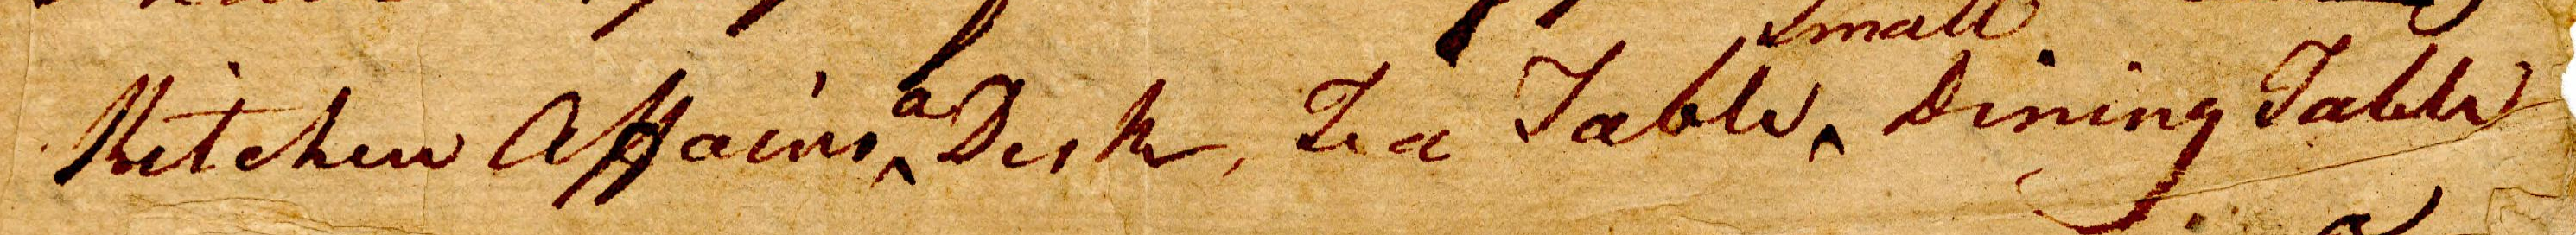kitchen Apliances ^a Desk, Tea table, dining Table
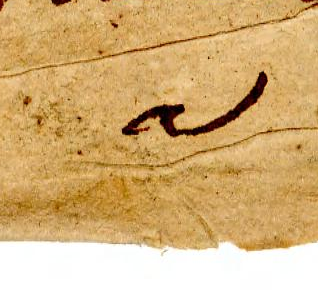a
